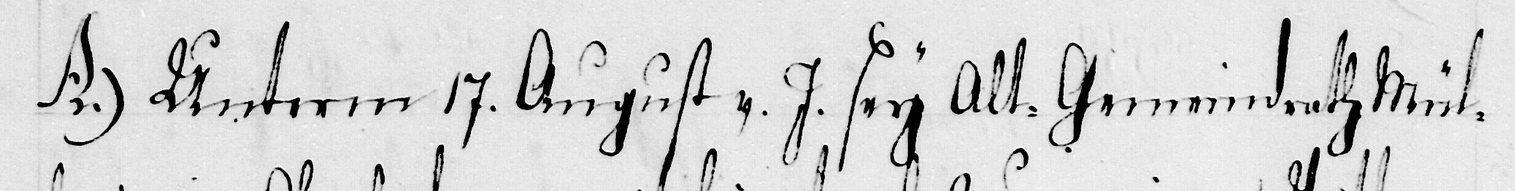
A.) Unterm 17. August v. J. sey Alt-Gemeindrath Mül¬
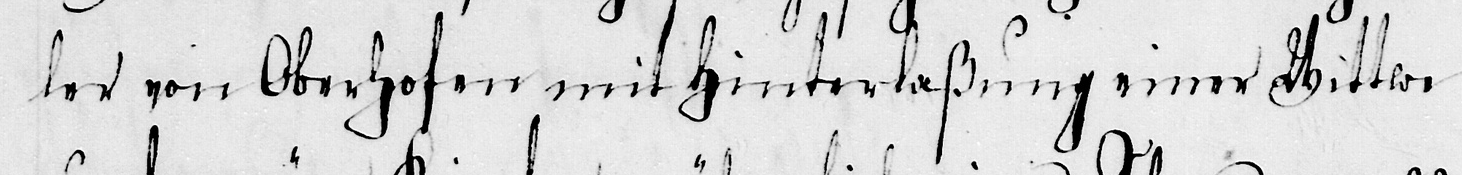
ler von Oberhofen mit Hinterlaßung einer Wittwe
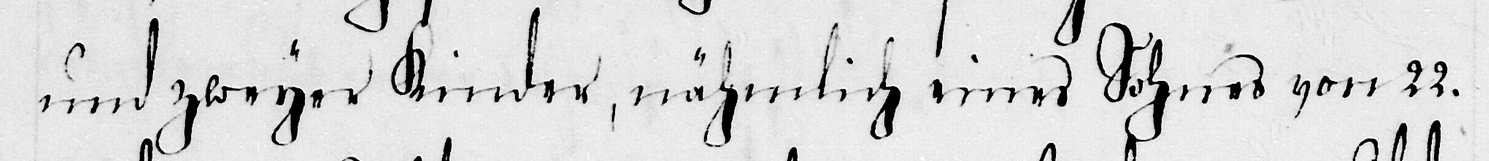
und zweyer Kinder, nähmlich eines Sohnes von 22.
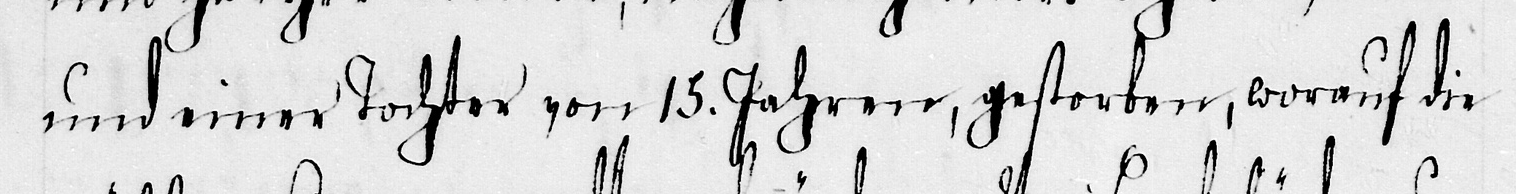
und einer Tochter von 15. Jahren, gestorben, worauf die
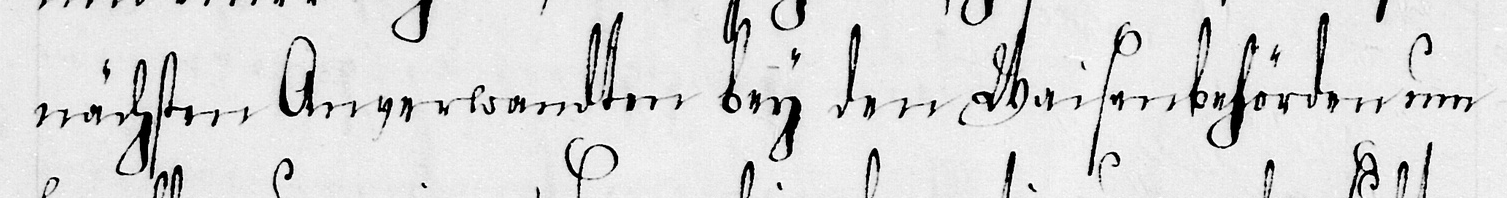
nächsten Anverwandten bey den Waisenbehörden um
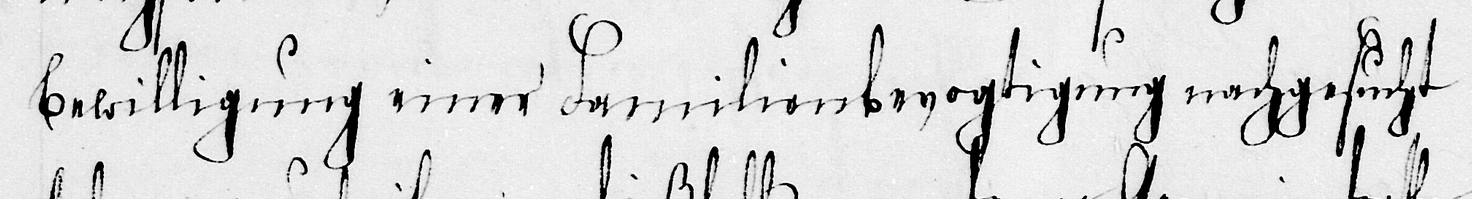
Bewilligung einer Familienbevogtigung nachgesucht
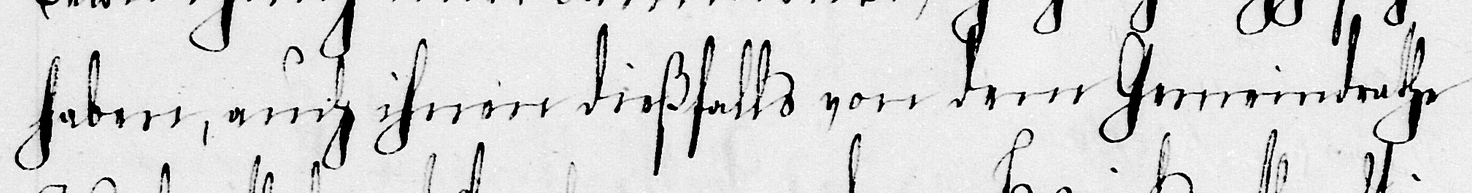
haben, auch ihnen dießfalls von dem Gemeindrathe
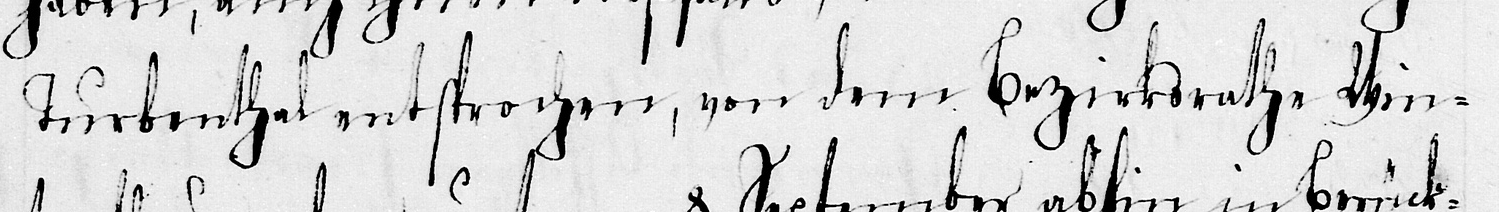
Turbenthal entsprochen, von dem Bezirksrathe Win¬
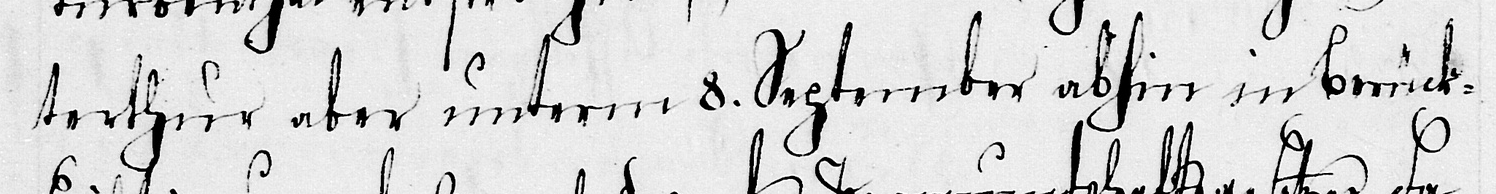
terthur aber unterm 8. September abhin in Berück¬
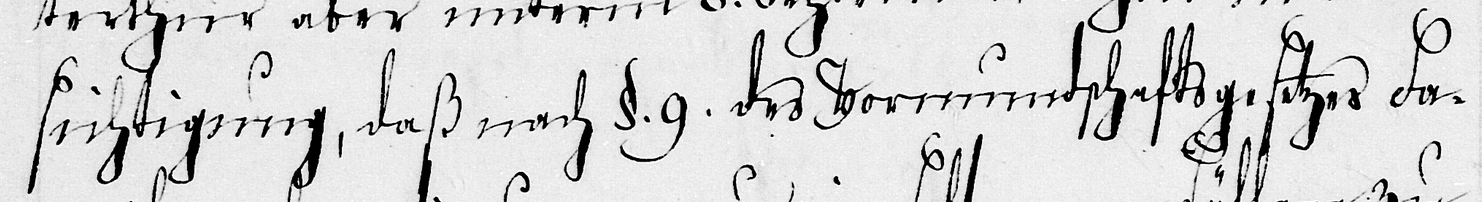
sichtigung, daß nach §. 9. des Vormundschaftsgesetzes Fa¬
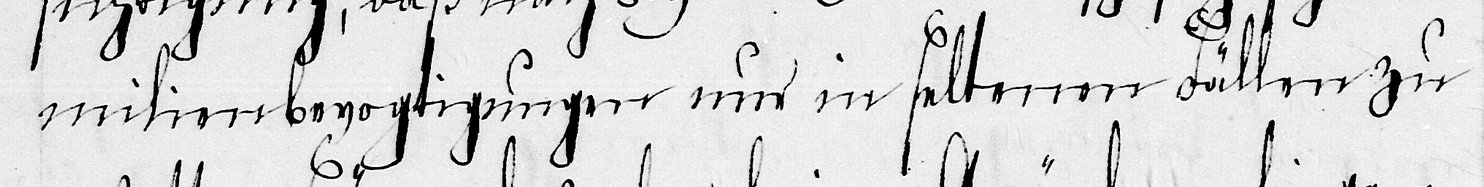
milienbevogtigungen nur in seltenen Fällen zu
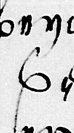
so¬
